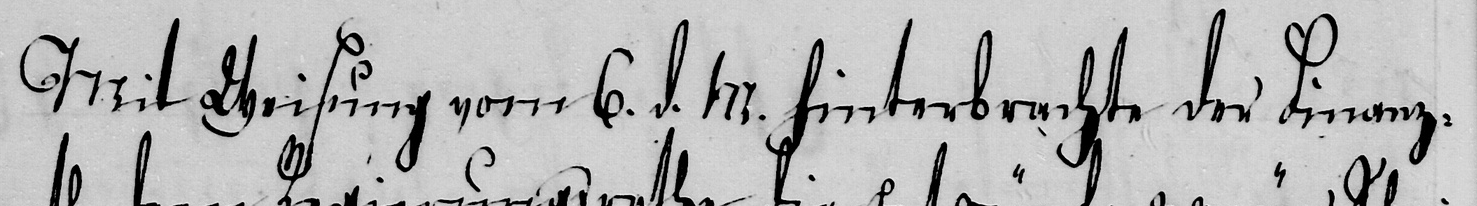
Mit Weisung vom 6. d. M. hinterbrachte der Finanz¬
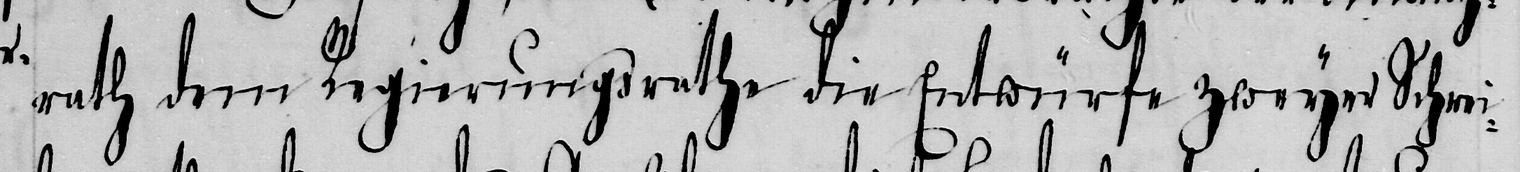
rath dem Regierungsrathe die Entwürfe zweyer Schrei¬
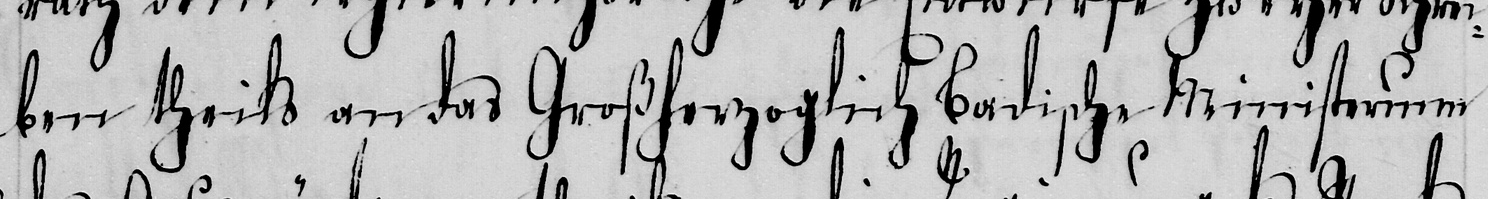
ben theils an das Großherzoglich Badische Ministerium
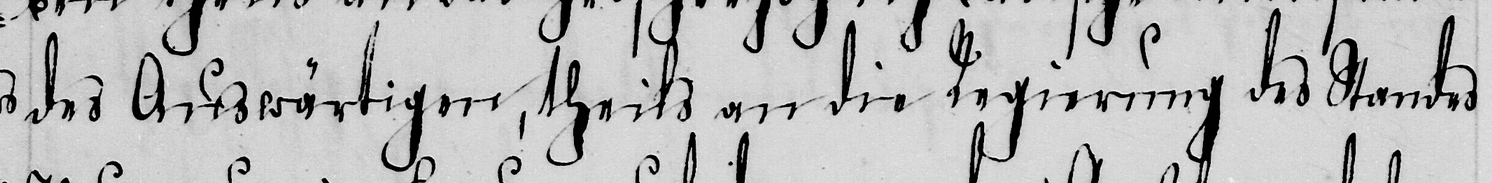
des Auswärtigen, theils an die Regierung des Standes
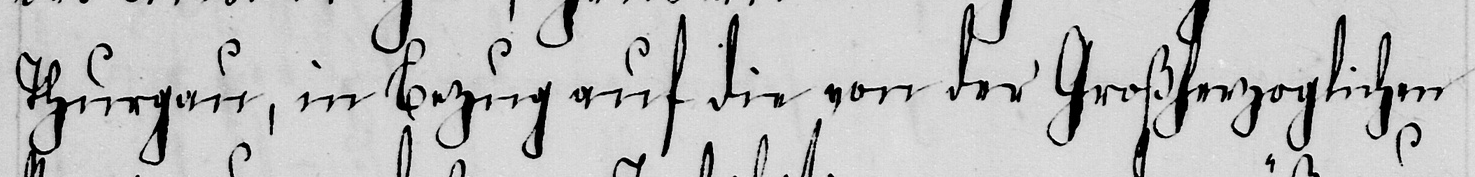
Thurgau, in Bezug auf die von der Großherzoglichen
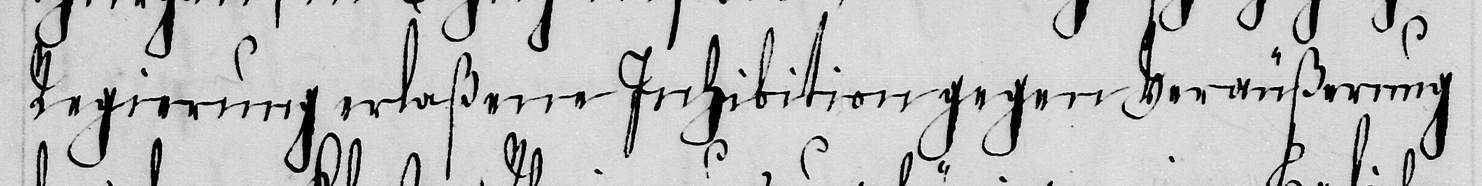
Regierung erlaßene Inhibition gegen Veräußerung
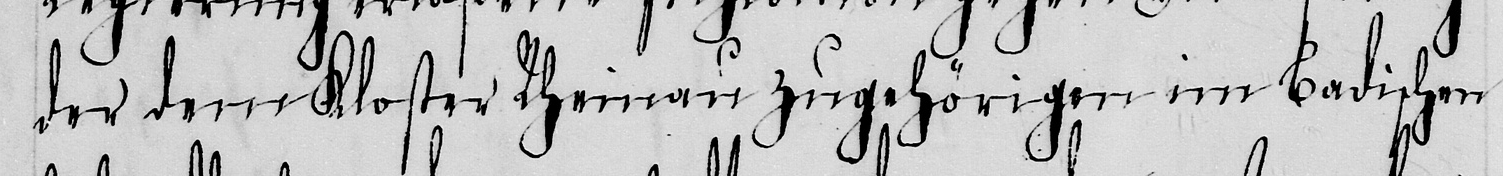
der dem Kloster Rheinau zugehörigen im Badischen
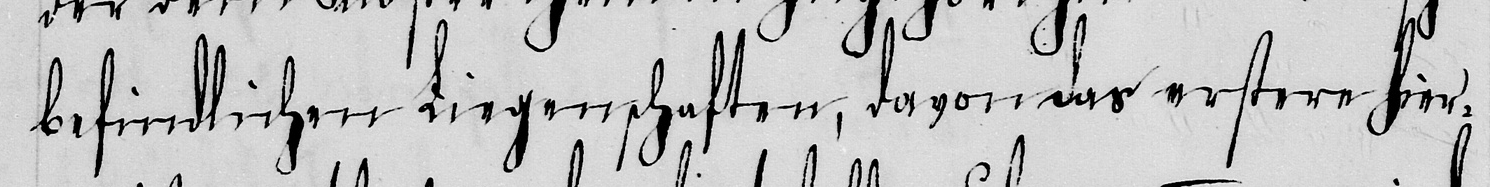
befindlichen Liegenschaften, davon das erstere hier¬
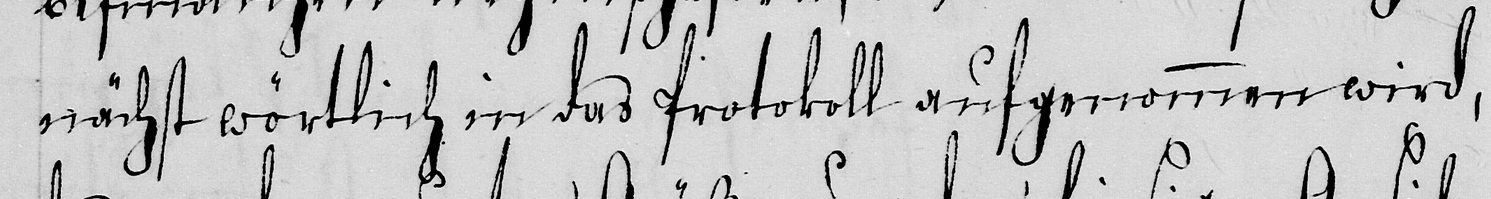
nächst wörtlich in das Protokoll aufgenommen wird,
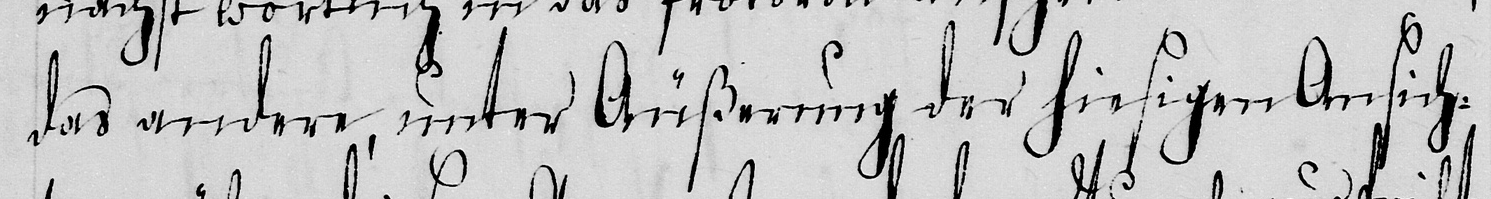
das andere, unter Äußerung der hiesigen Ansich¬
